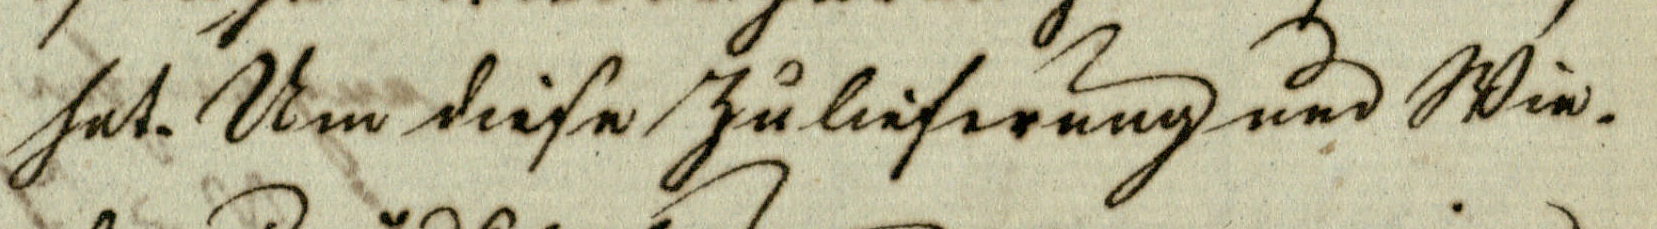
hat. Um diese Zulieferung und Wie¬
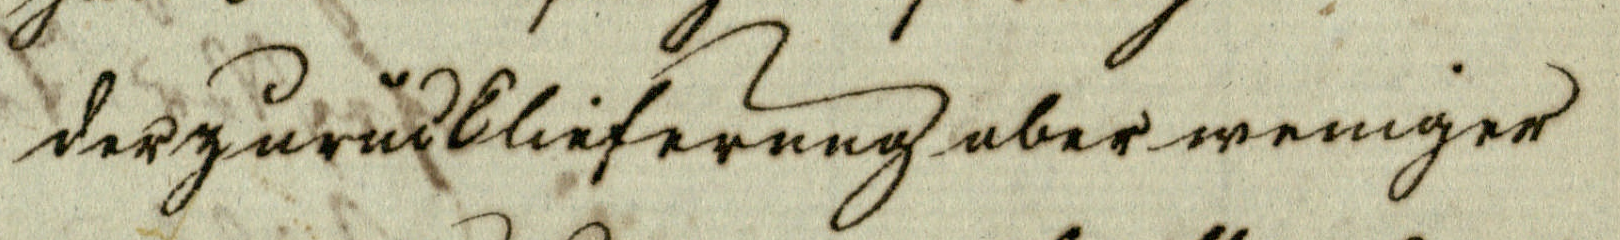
derzurücklieferung aber weniger
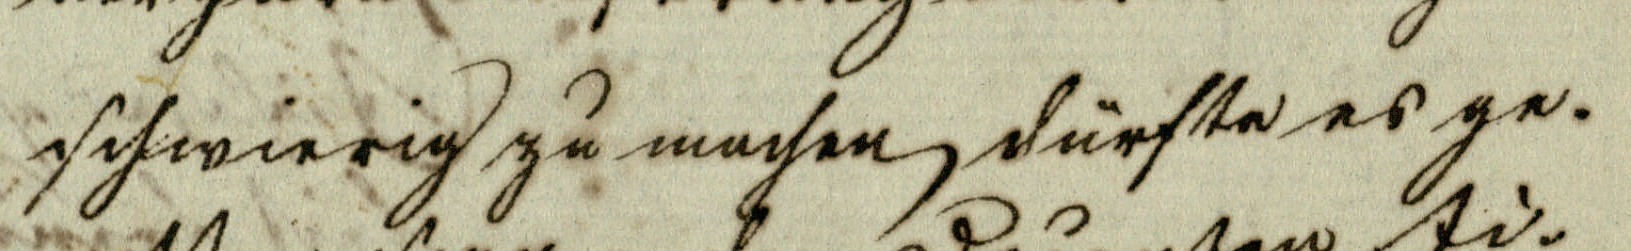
schwierig zu machen, dürfte es ge¬
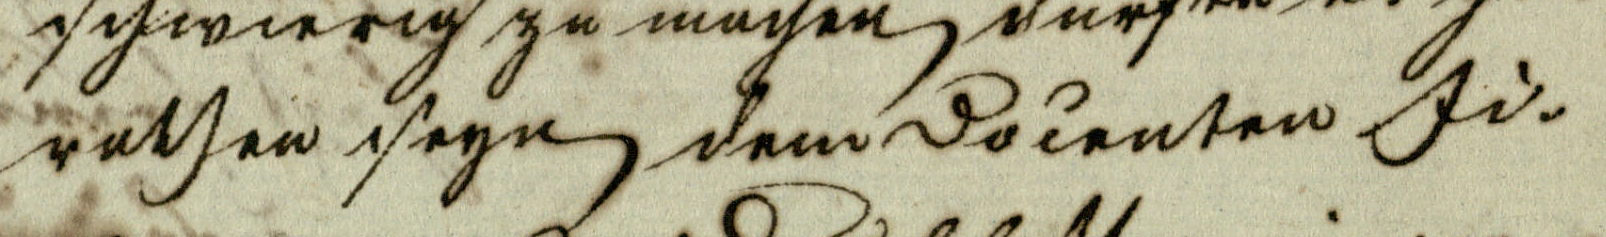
rathen seyn dem Docenten Fi¬
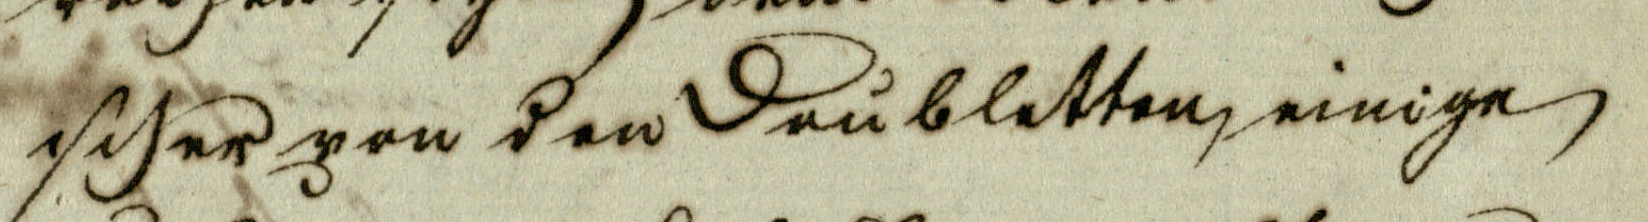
scher von den Doubletten einige
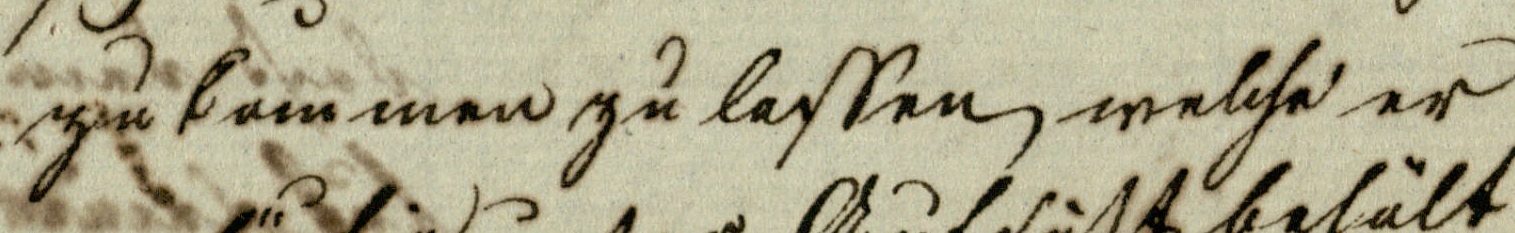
zu kommen zu lassen, welche er
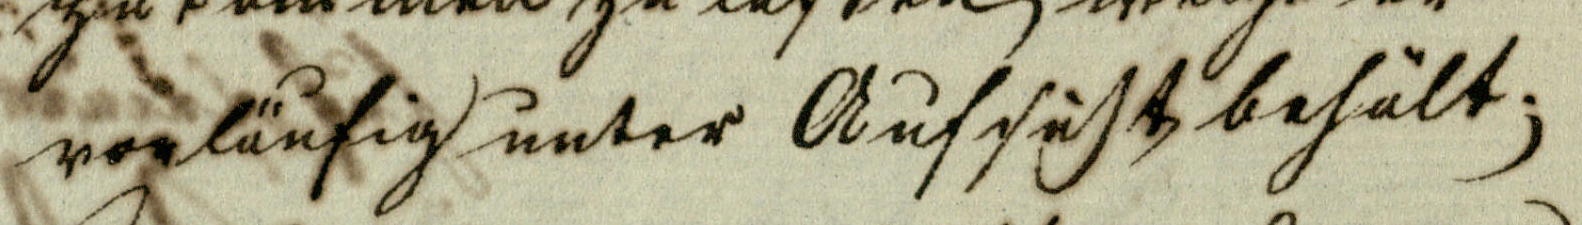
vorläufig unter Aufsicht behält;
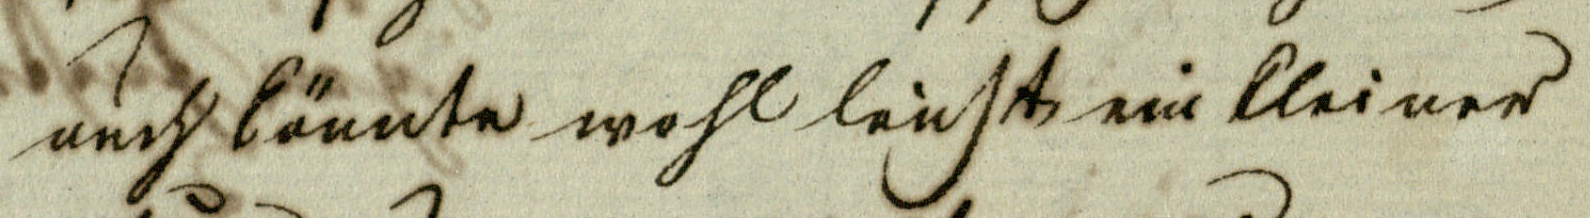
auch könnte wohl leicht ein kleiner
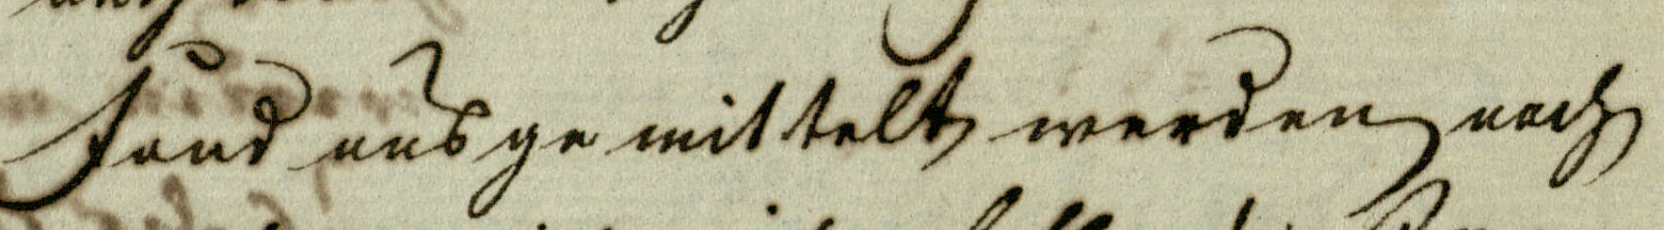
Fond ausgemittelt werden nach
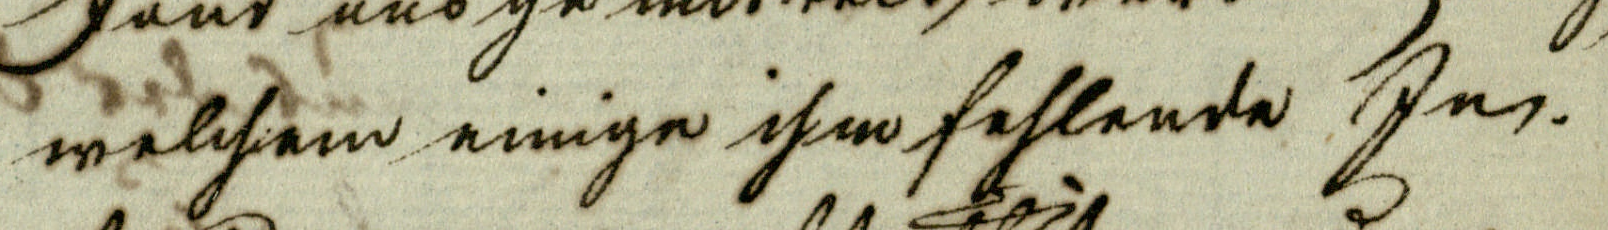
welchem einige ihm fehlende In¬
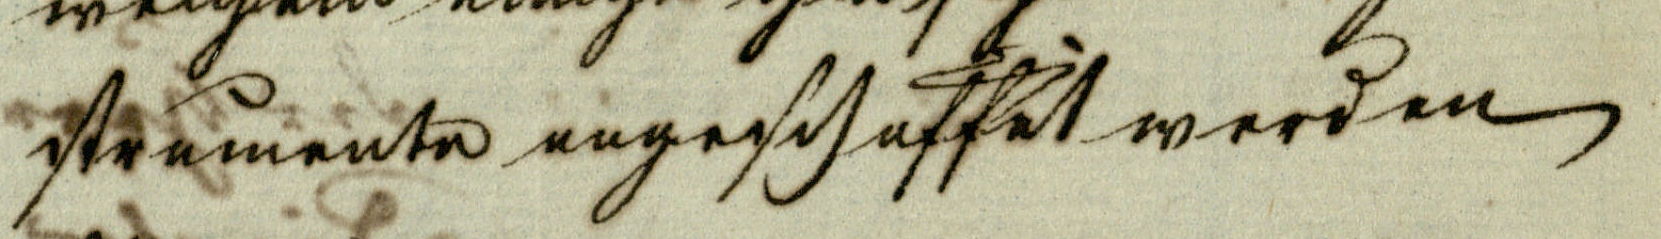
strumente angeschaffet werden
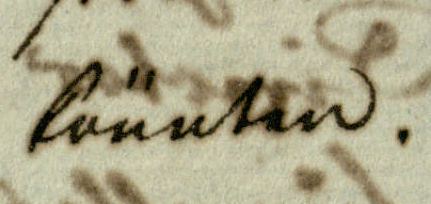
könnten.
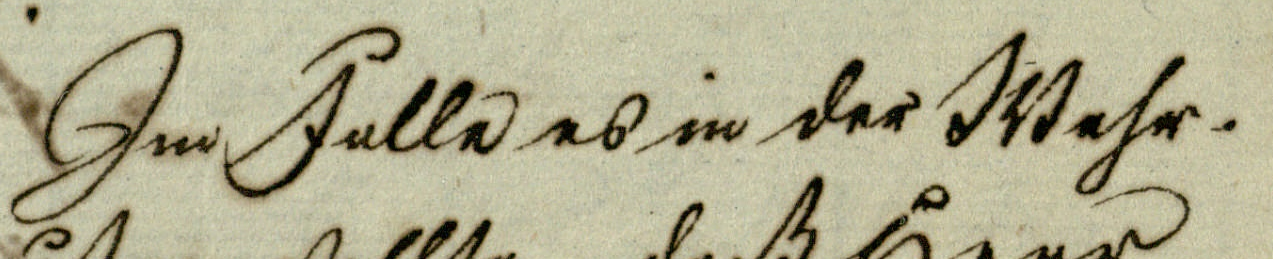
Im Falle es in der Wahr¬
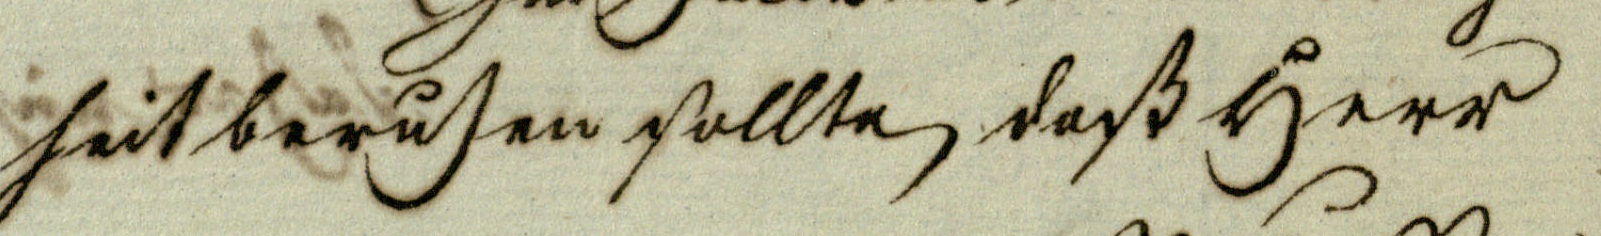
heit beruhen sollte, daß Herr
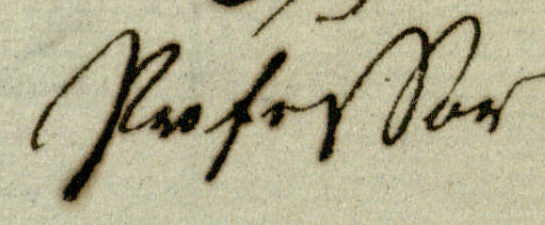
Professor
